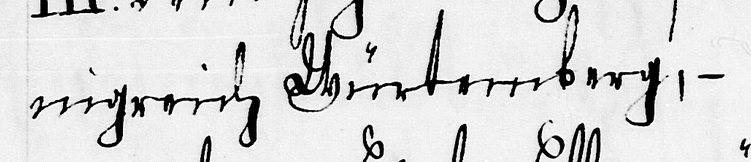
nigreich Würtemberg,
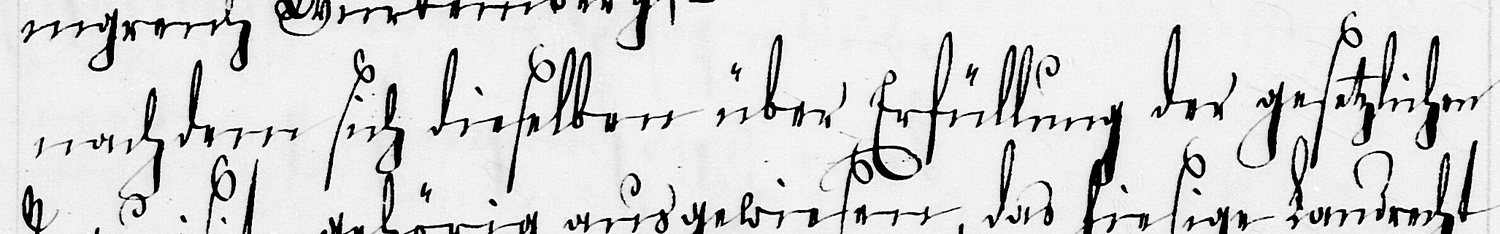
nachdem sich dieselben über Erfüllung der gesetzlic¬
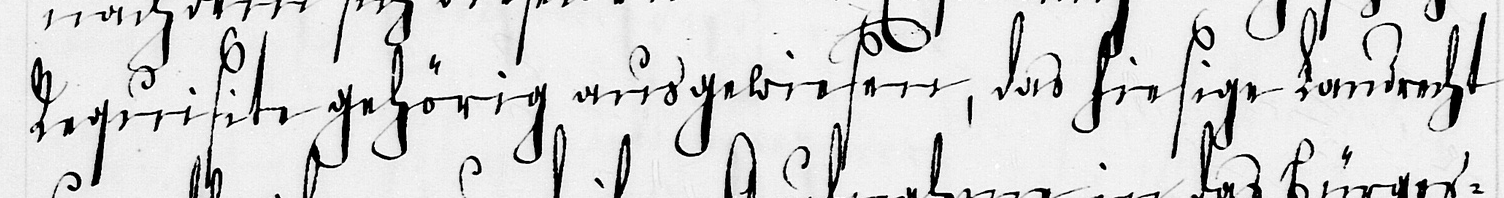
Requisite gehörig ausgewiesen, das hiesige Landrecht
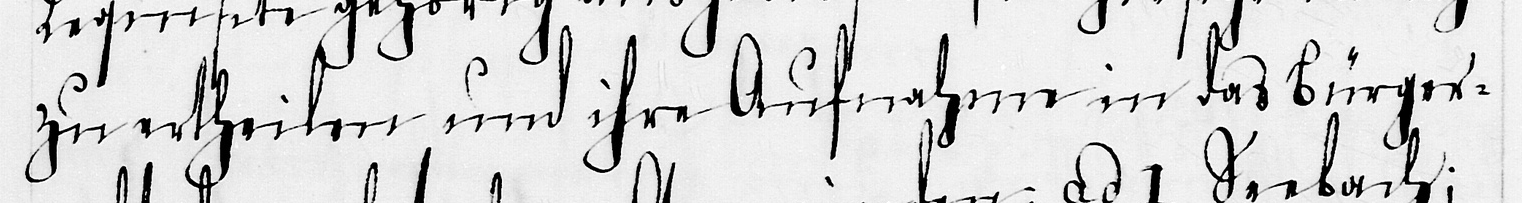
zu ertheilen und ihre Aufnahme in das Bürger¬
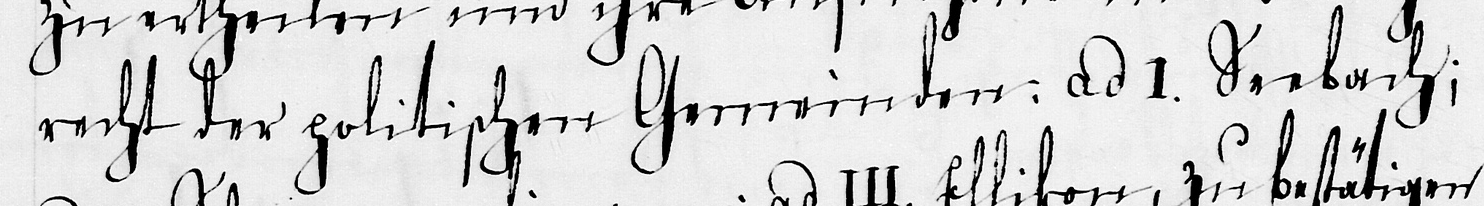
recht der politischen Gemeinden: ad I. Seebach;
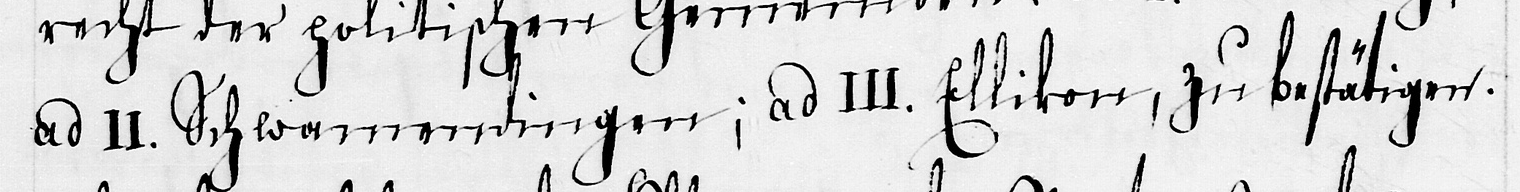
ad II. Schwamendingen; ad III. Ellikon, zu bestätigen.
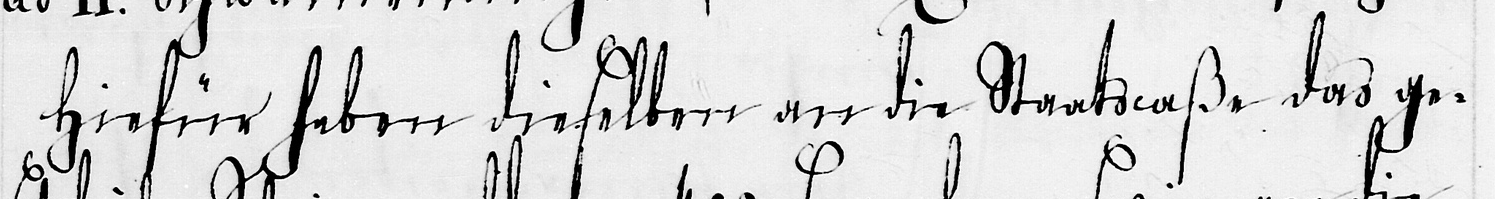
Hiefür haben dieselben an die Staatscaße das ge¬
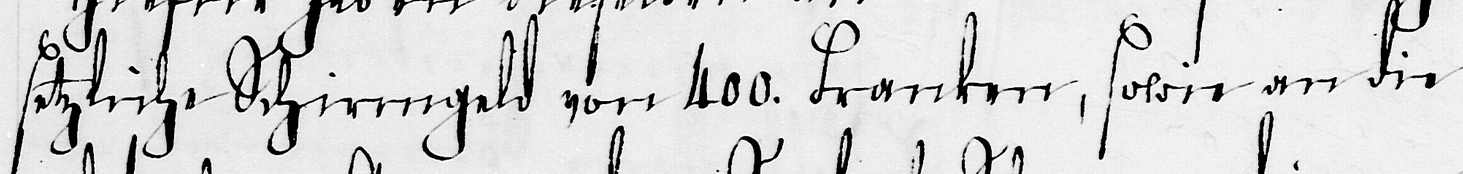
setzliche Schirmgeld von 400. Franken, sowie an die
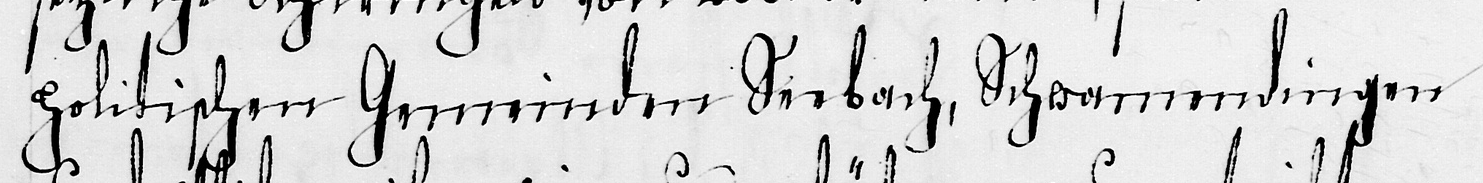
politischen Gemeinden Seebach, Schwamendingen
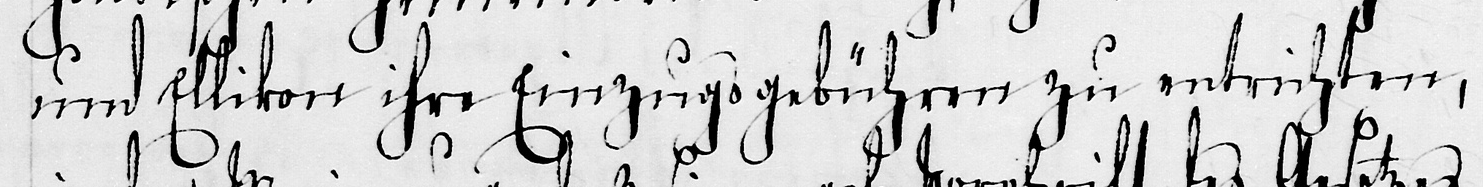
und Ellikon ihre Einzugsgebühren zu entrichten,
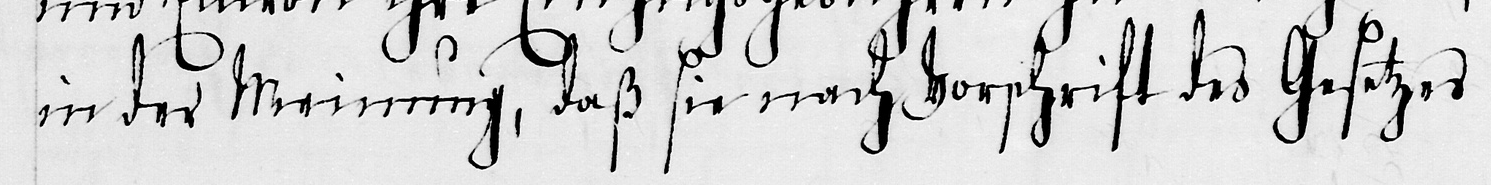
in der Meinung, daß sie nach Vorschrift des Gesetzes
